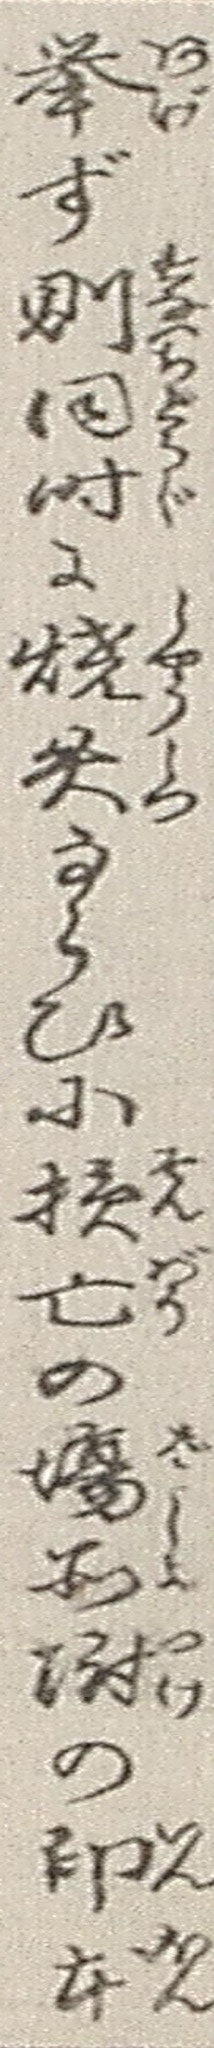挙ず則同時に焼失ならひに損亡の場所附の印本
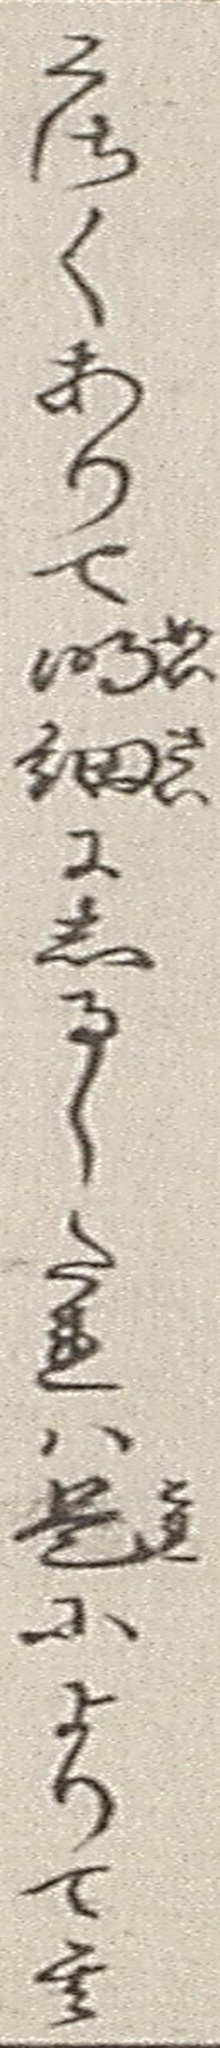くさ〳〵ありて明細にしるしたれは是によりて其
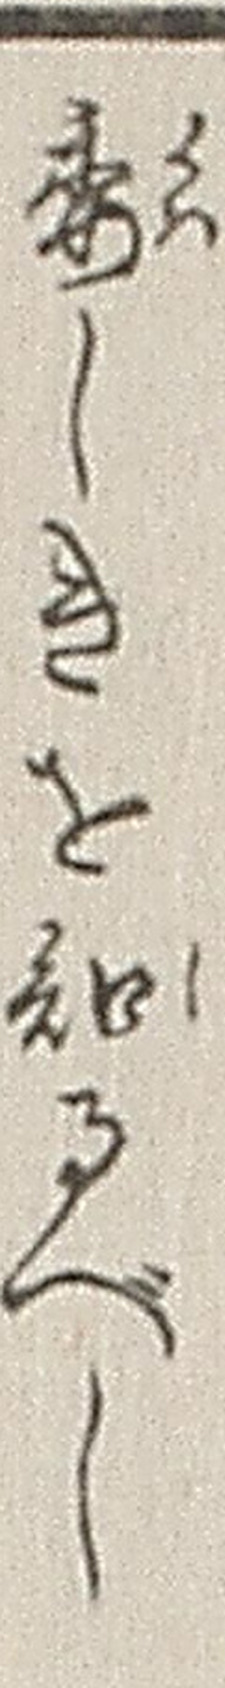委しきを知るべし
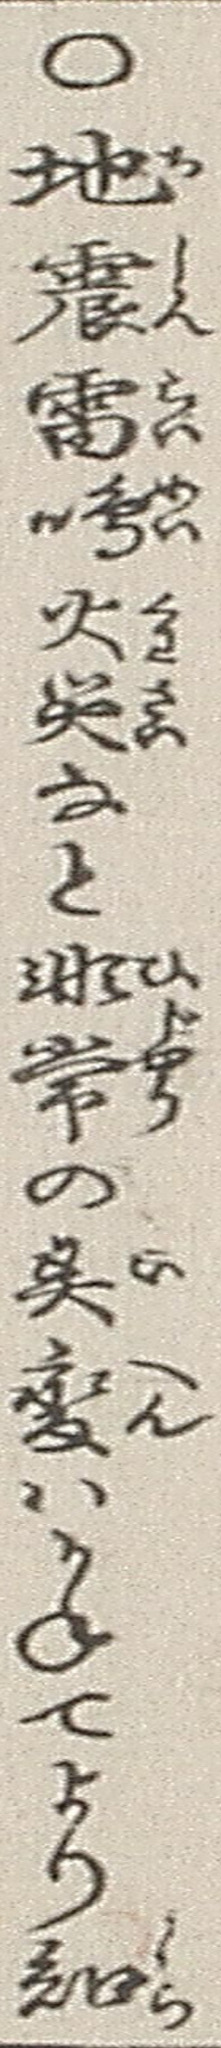○地震雷鳴火災なと非常の異変はかねてより知
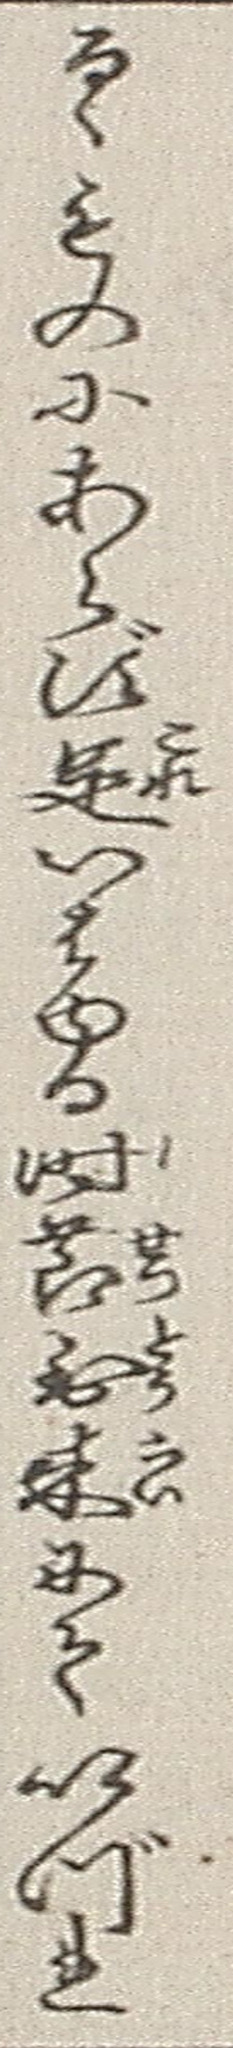るゝものにあらず是いはゆる時節到来にていづれ
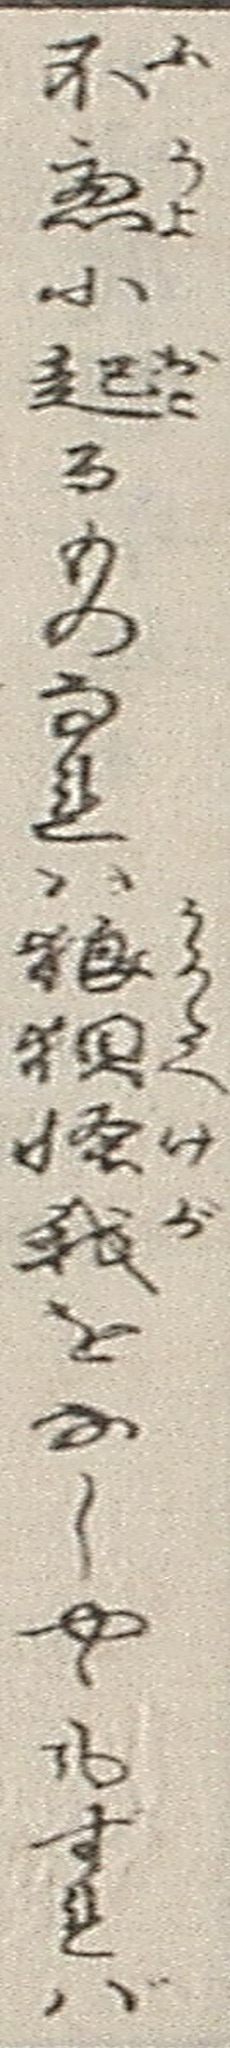不慮に起るものなれは狼狽怪我をなしやゝもすれば
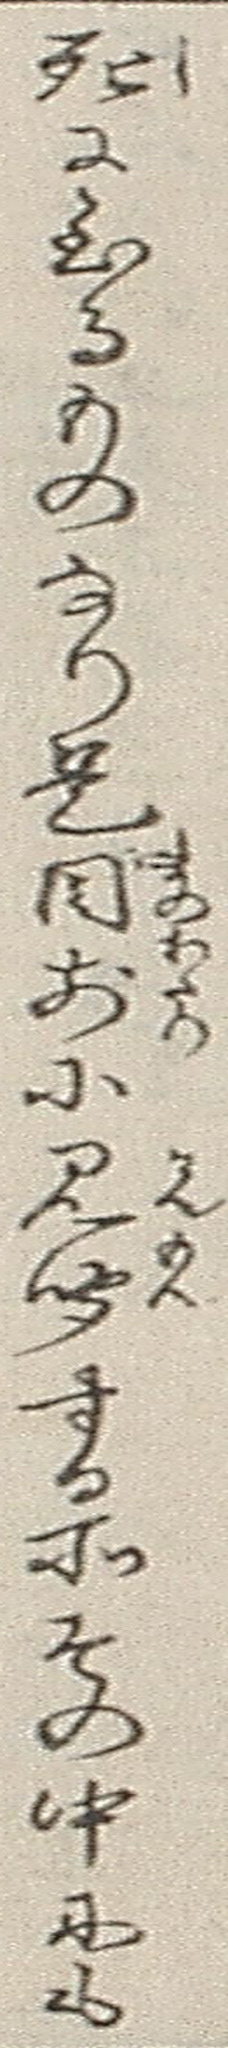死に至るものなり是目前に見聞する所その中にも
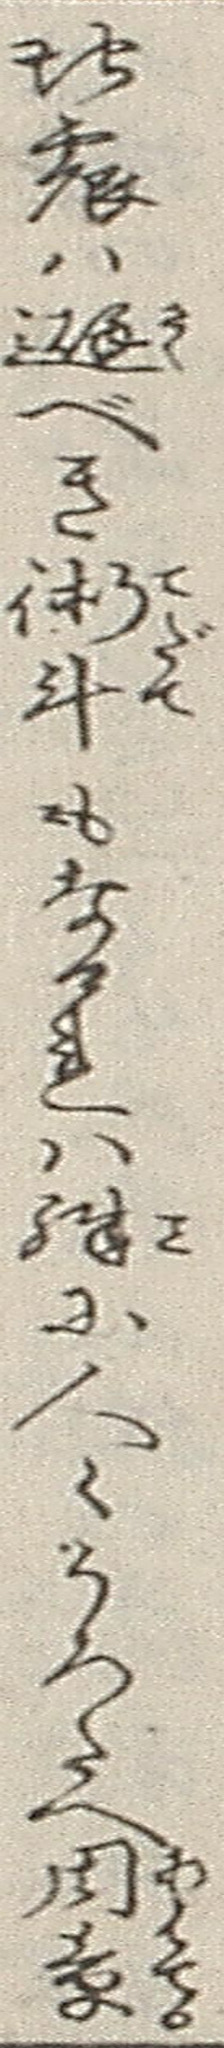地震は避べき術計もなけれは殊に人々うろたへ周章
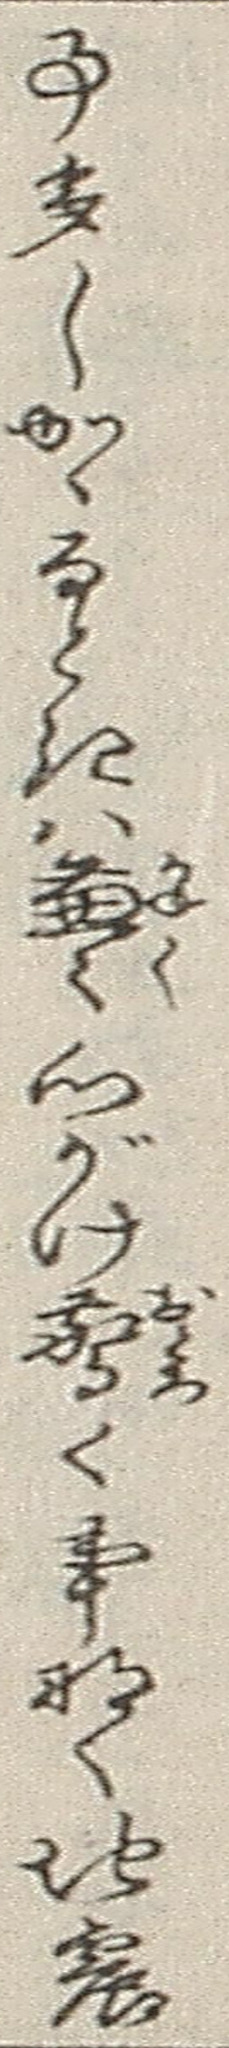事多しかゝるときは兼〻心がけ驚く事なく地震
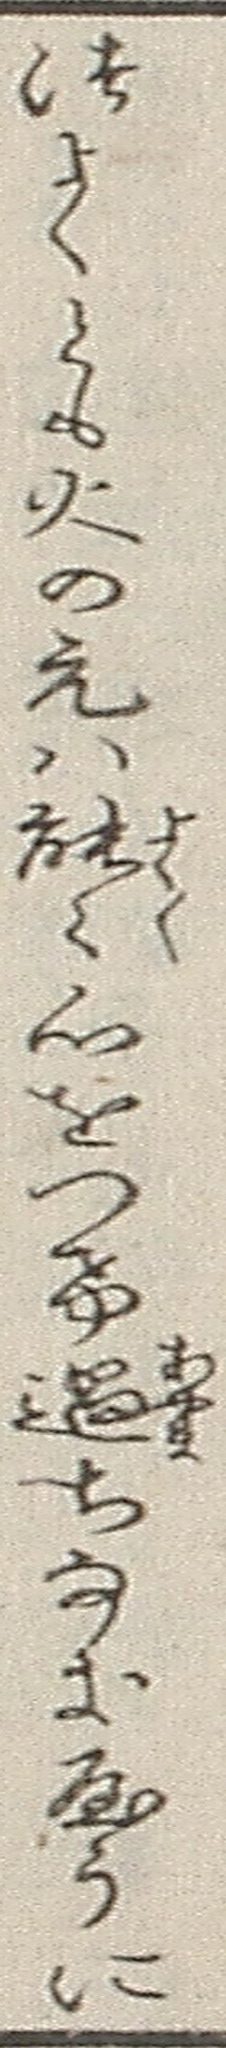つよくとも火の元は能々心をつけ過ちなきやうに
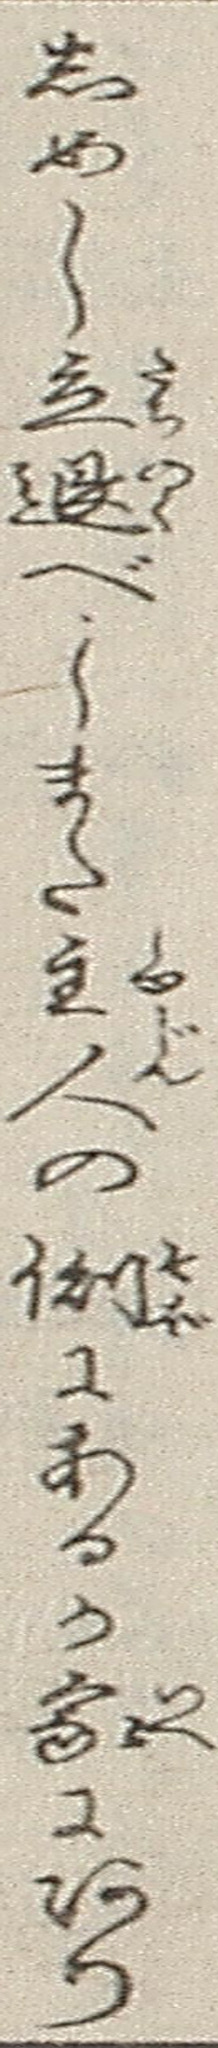しめし立退べしまた主人の側にあるか家にあり

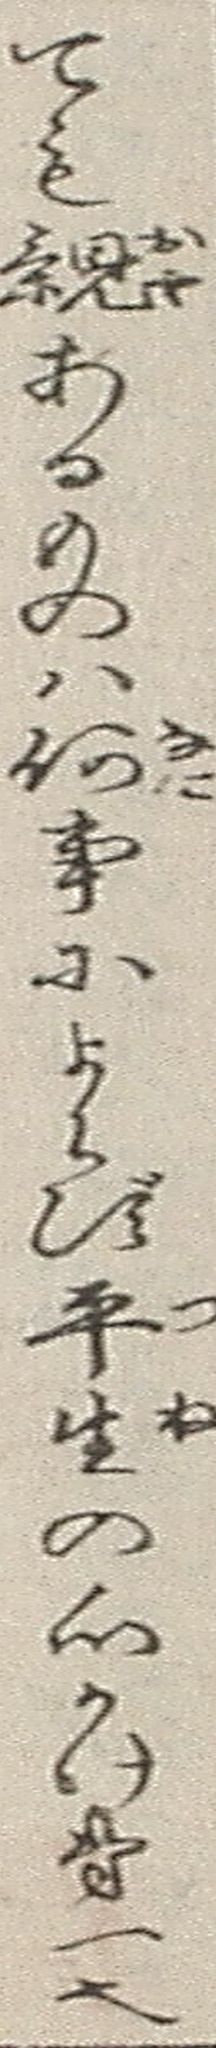ても親あるものは何事によらず平生の心かけ第一也
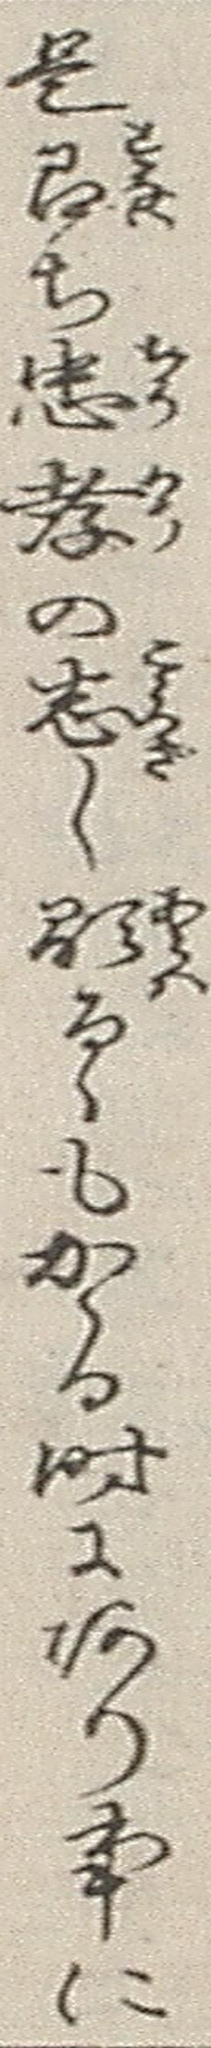是即ち忠孝の志し顕るゝもかかる時にあり事に
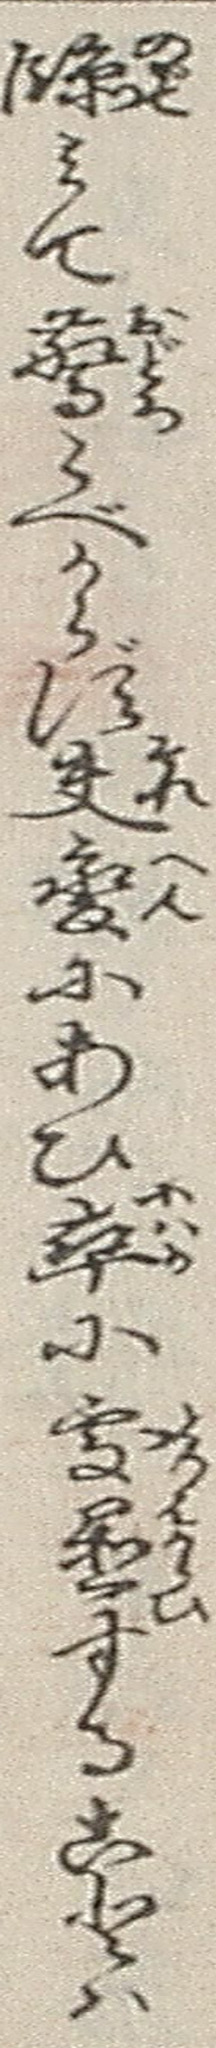臨みて驚くべからず夫変にあひ卒に処置することは
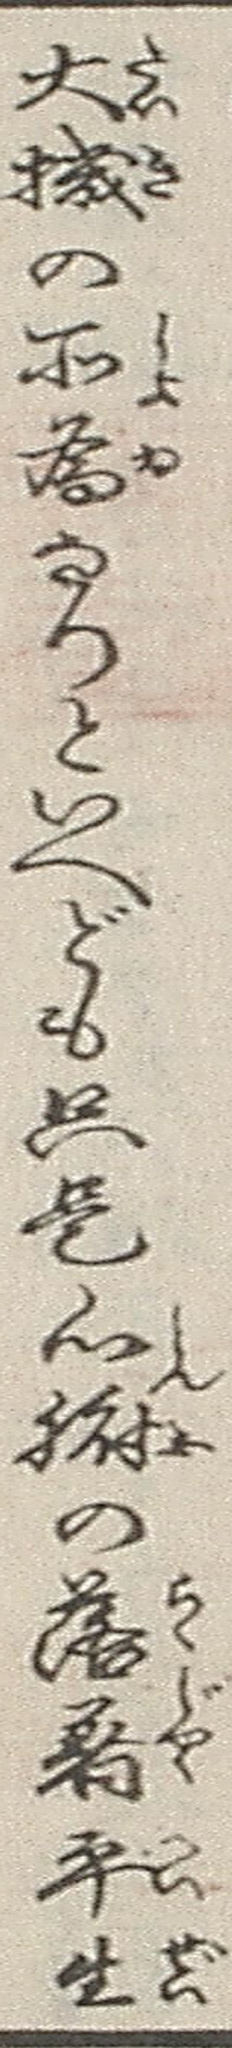大機の所為なりといへども只是心腑の落着平生
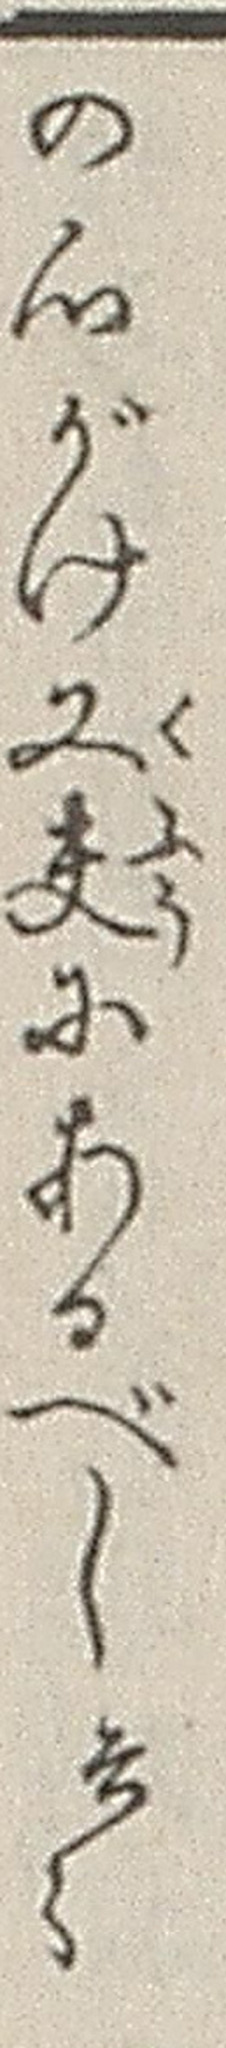の心がけ工夫にあるべし云〻
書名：大地震暦年考　全
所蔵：東京大学地震研究所図書室 Earthquake Research Institute Library, The University of Tokyo, JAPAN
